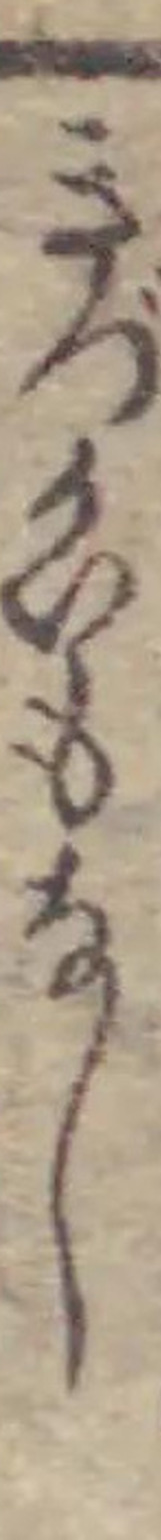きづかいもなし
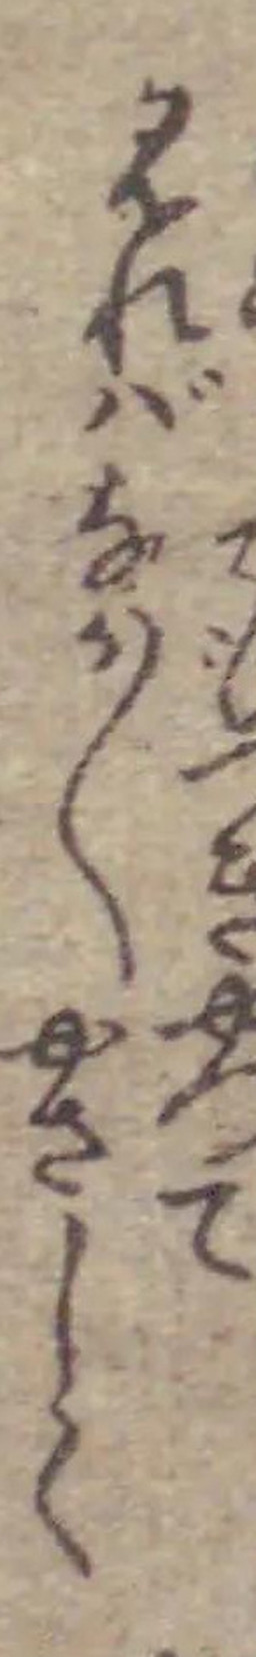見ればなか〳〵やさしく
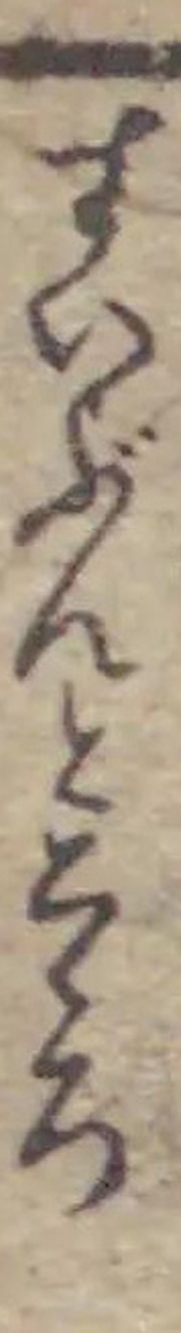ずいぶんとこゝろ
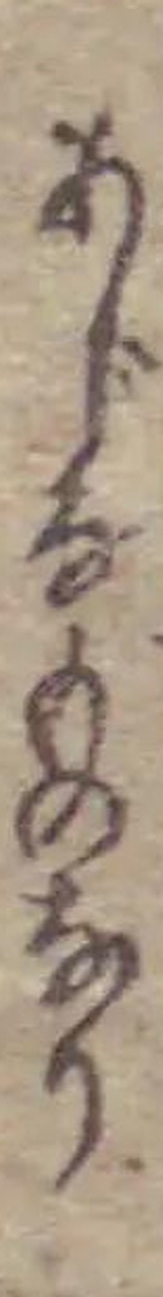あじなものなり
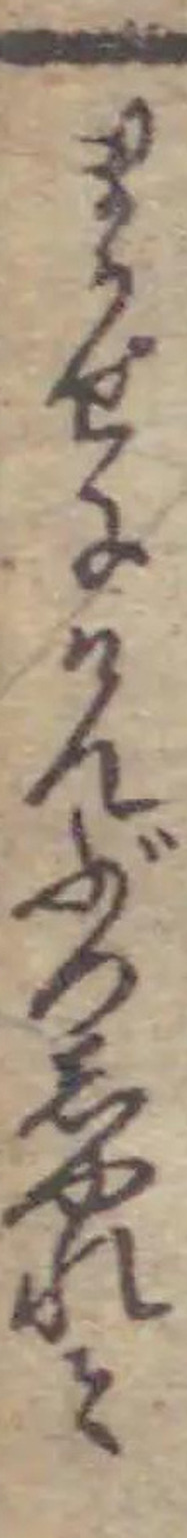まかせにけんぶつしやれと

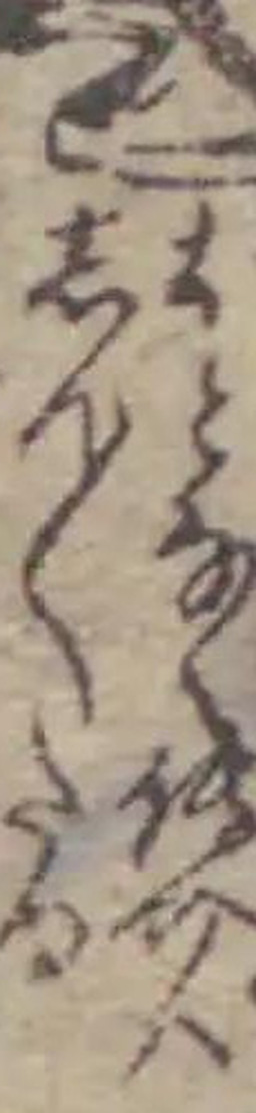しん〳〵たる
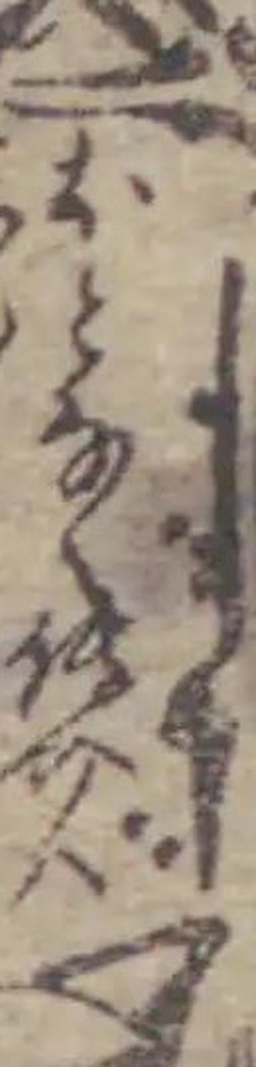ほとなく伝介は
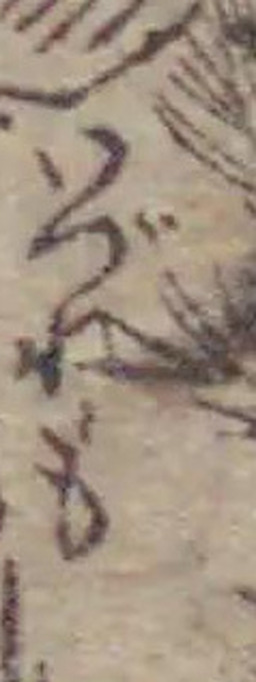いづれも
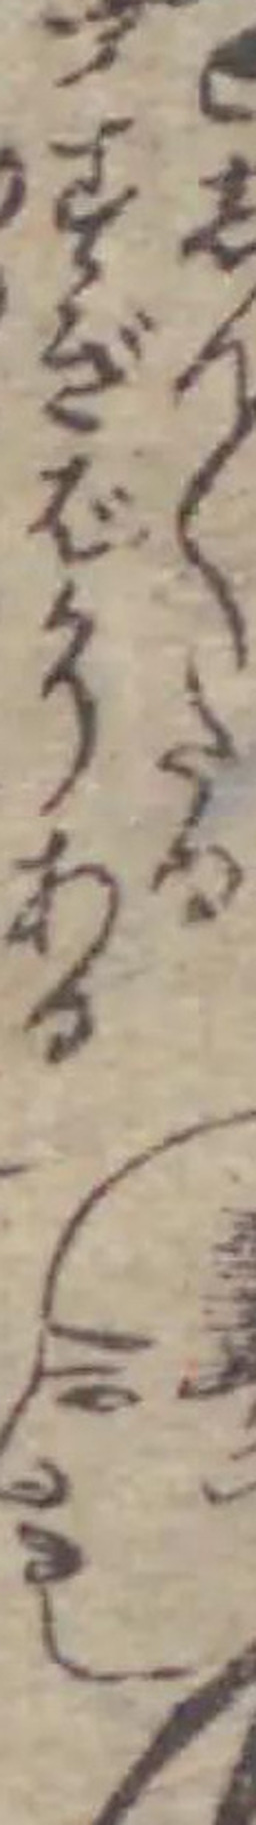すぎばかりある
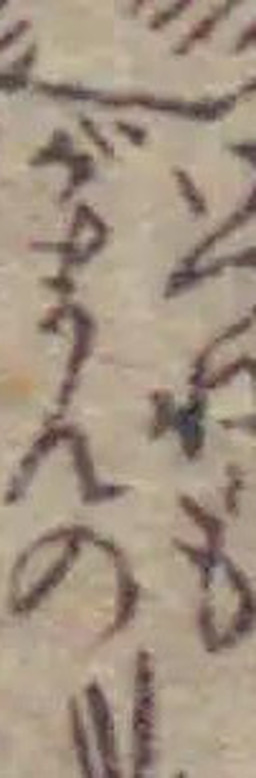がまんの
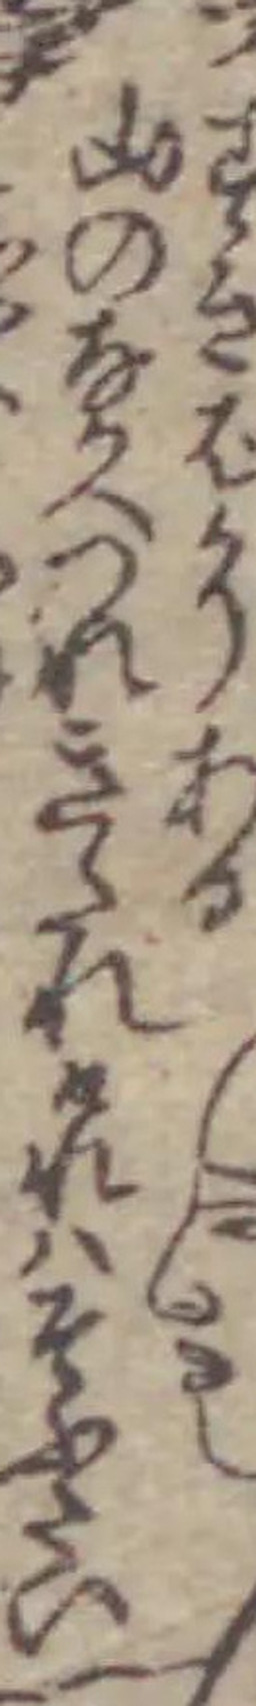山のなかへつれきたれけれはそふたい
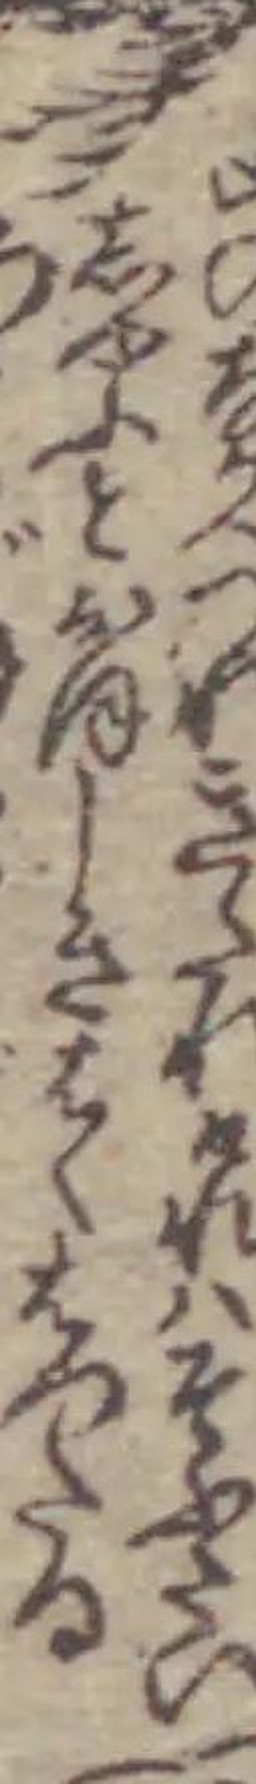しやふとおほしきはくはつたる
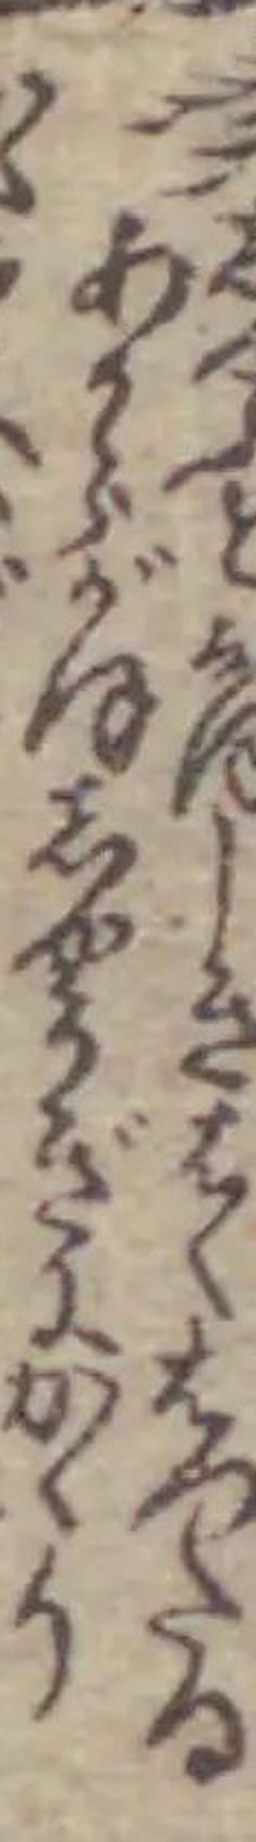あからがほしやうぎにかゝり
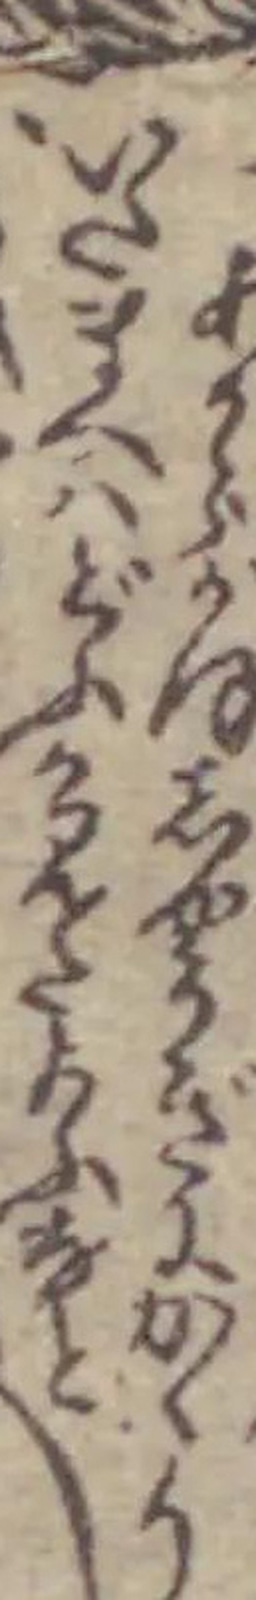いたまへはどふか見たよふなと
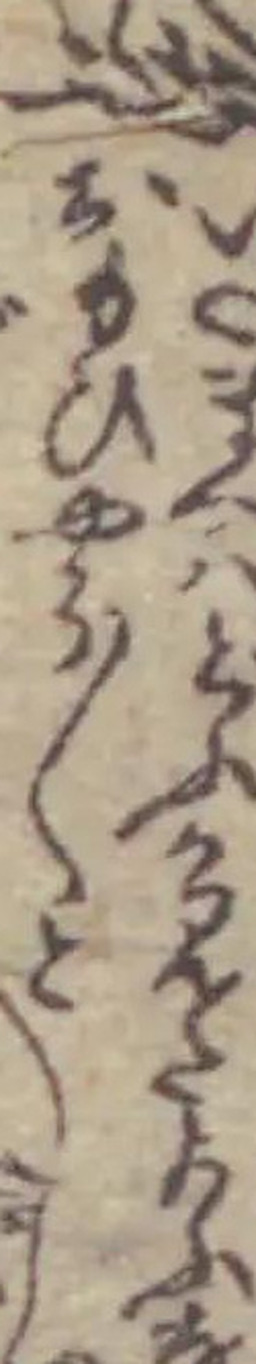おもひやう〳〵と
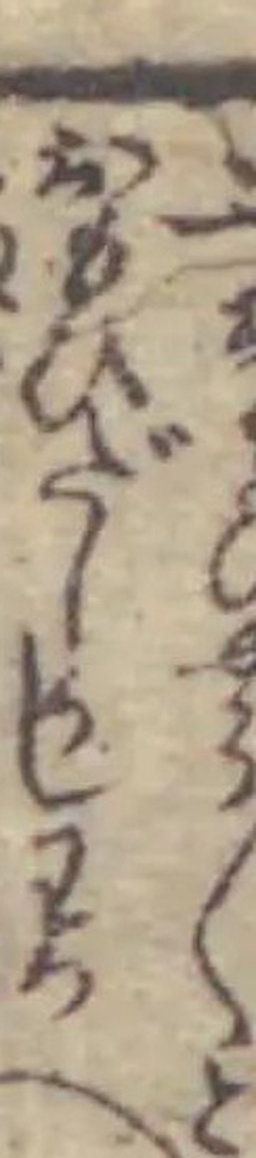おもひだしかしわか
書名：珍説女天狗 2巻
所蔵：国立国会図書館 National Diet Library, JAPAN
